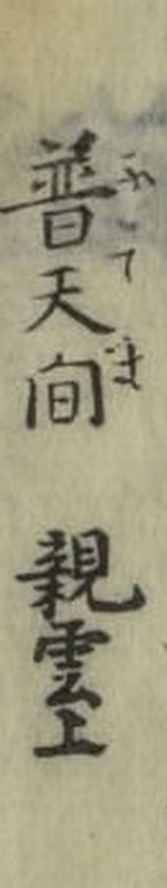普天間親雲上
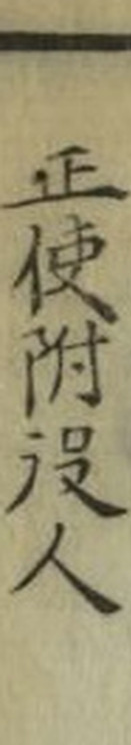正使附役人
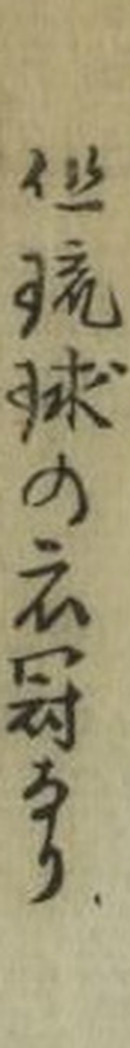但琉球の衣冠なり

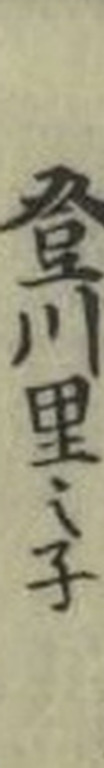登川里之子
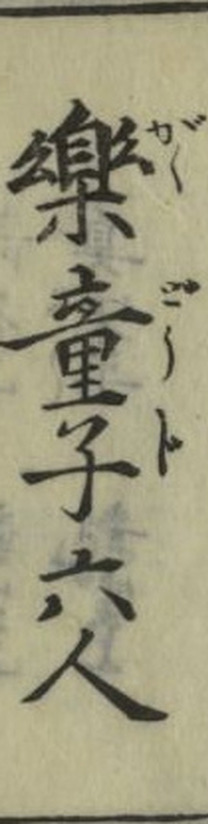楽童子六人
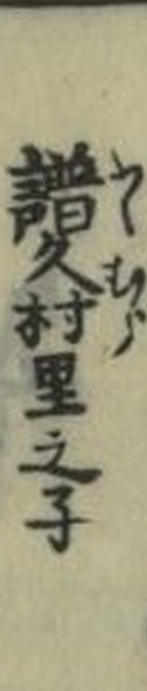譜久村里之子
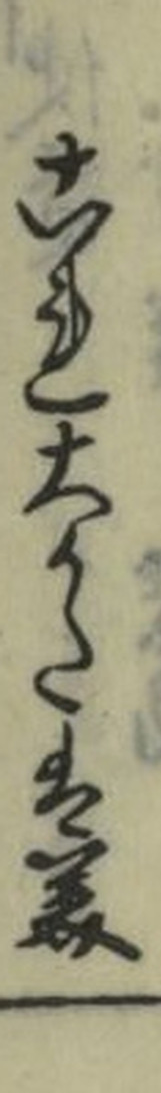これ大かたは美
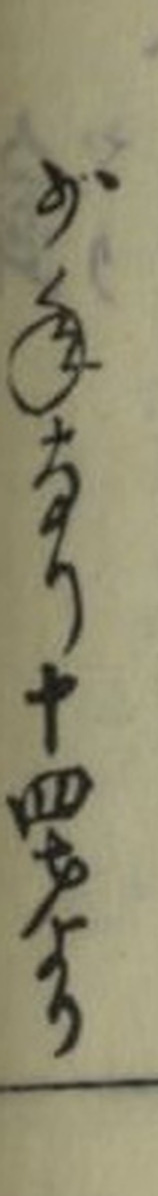少年なり十四才より
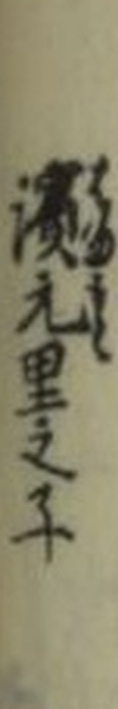濱元里之子
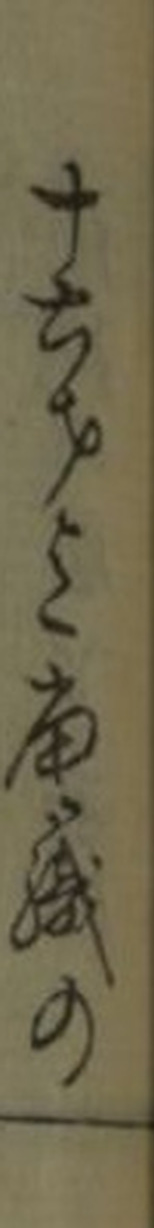十六才迄当御職の
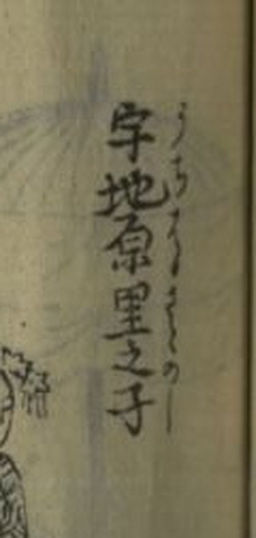宇地原里之子
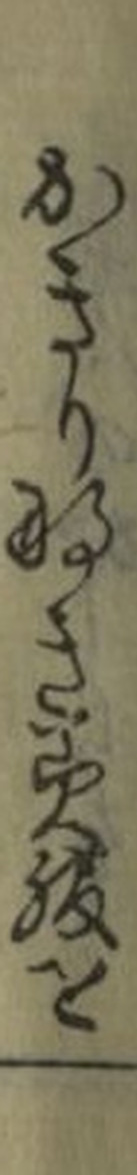かきりなき美服を
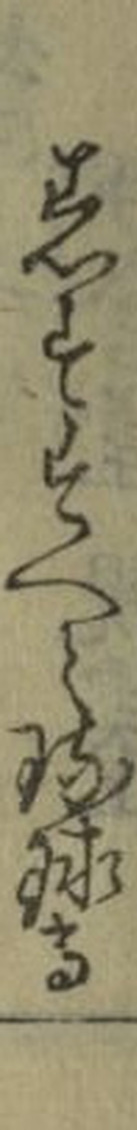着すすへて琉球高
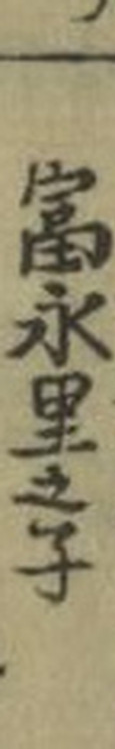富永里之子
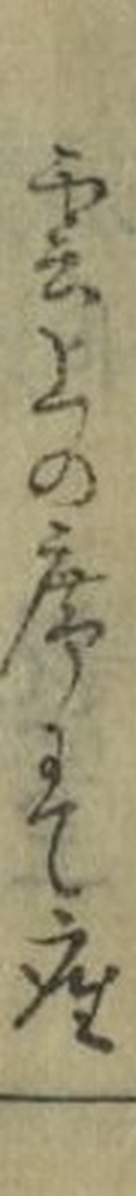雲上の席にて座
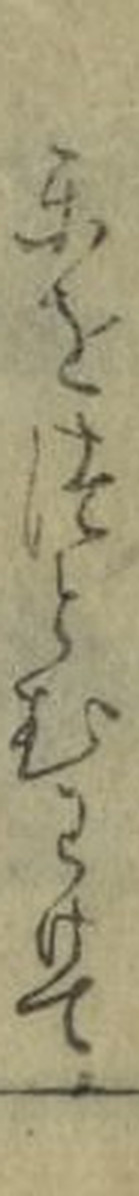楽をつとむわけて
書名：琉球人行列記
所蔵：University of the Ryukyus Library
